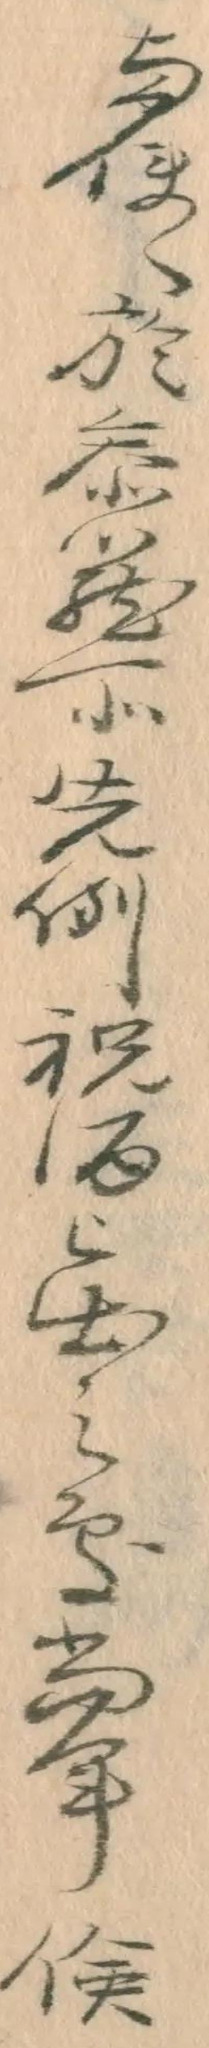両使へ於参籠所先例祝酒被出之處當年倹
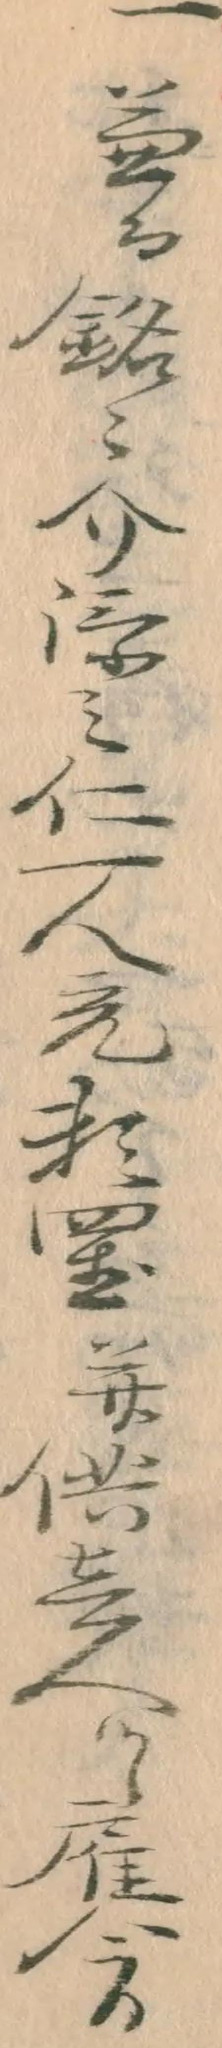一兼而銘々介添之仁一人充頼置幷供壱人ツヽ雇今日
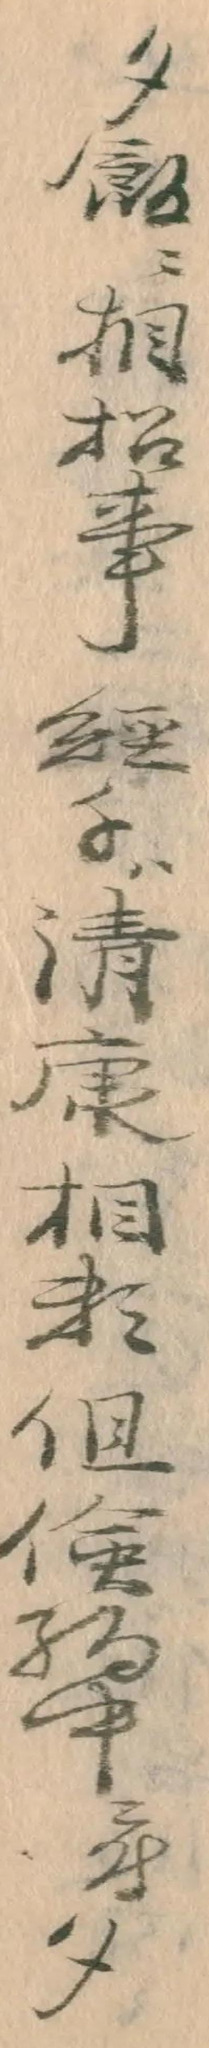夕飯ニ相招事経千ハ清康相頼但倹約中ニ付夕
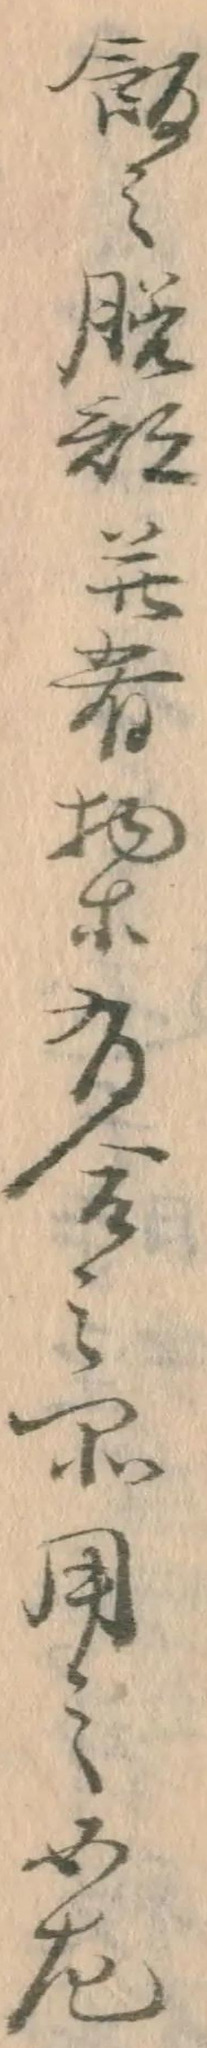飯之脱部并肴物等有合之品用之如左
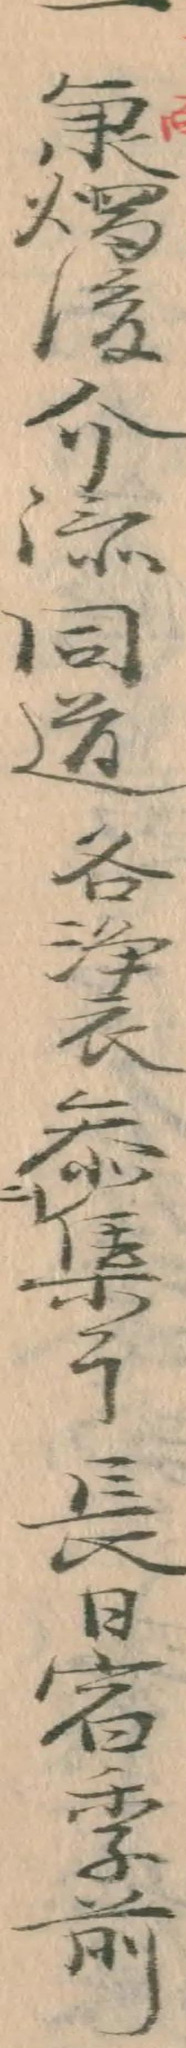一秉燭後介添同道各浄衣参集畢長日宿季前
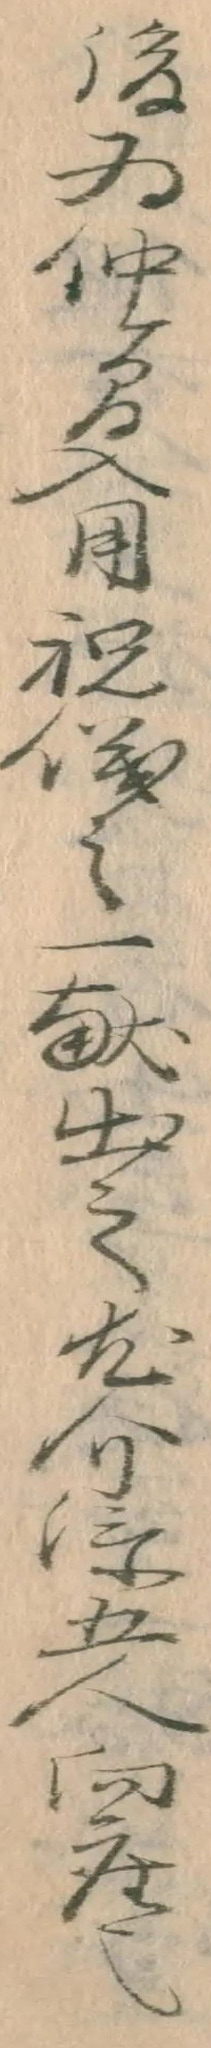後為仲ヶ間入用祝儀之一献出之尤介添五人向座也
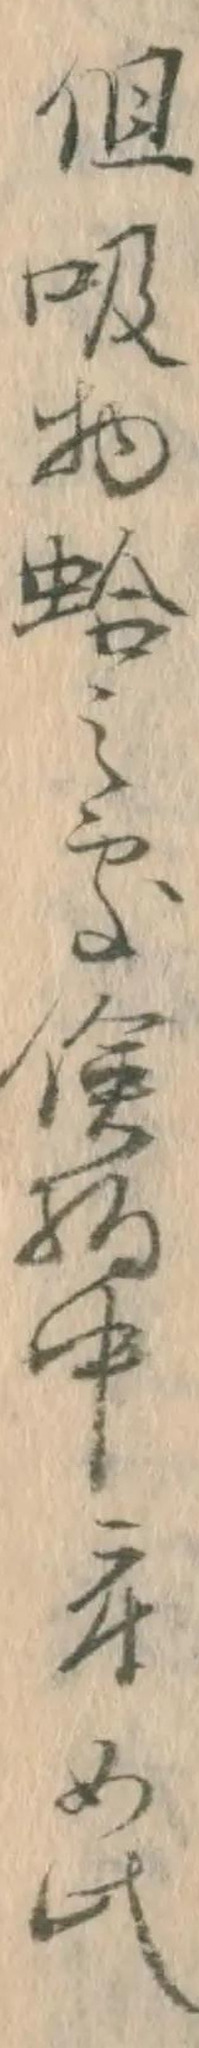但吸物蛤之處倹約中ニ付如此
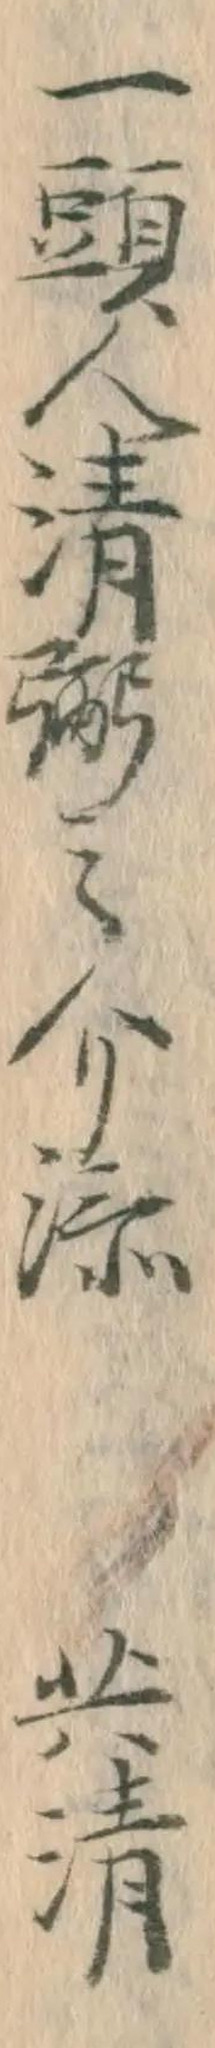一頭人清弼之介添共清
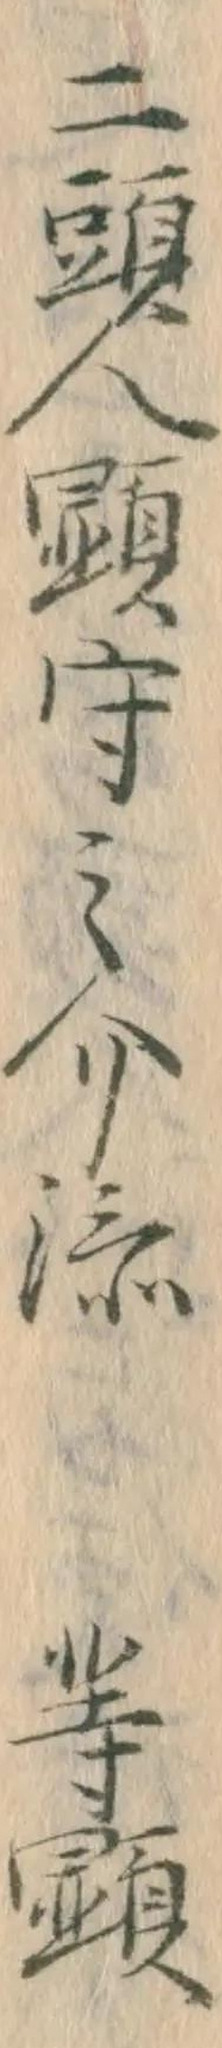二頭人顕守之介添等顕
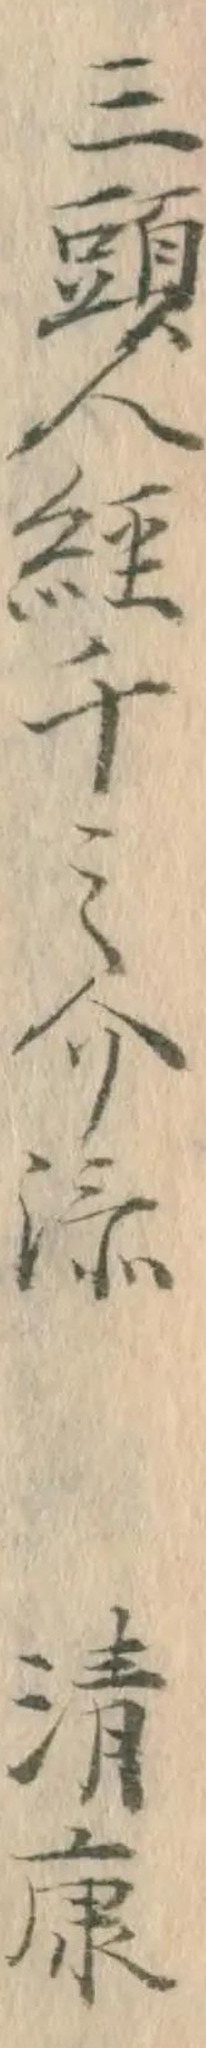三頭人経千之介添清康
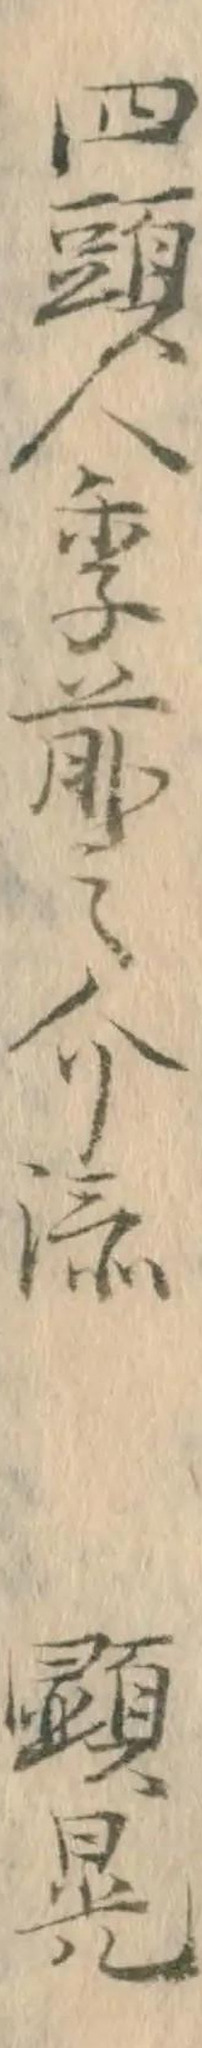四頭人季前之介添顕晃
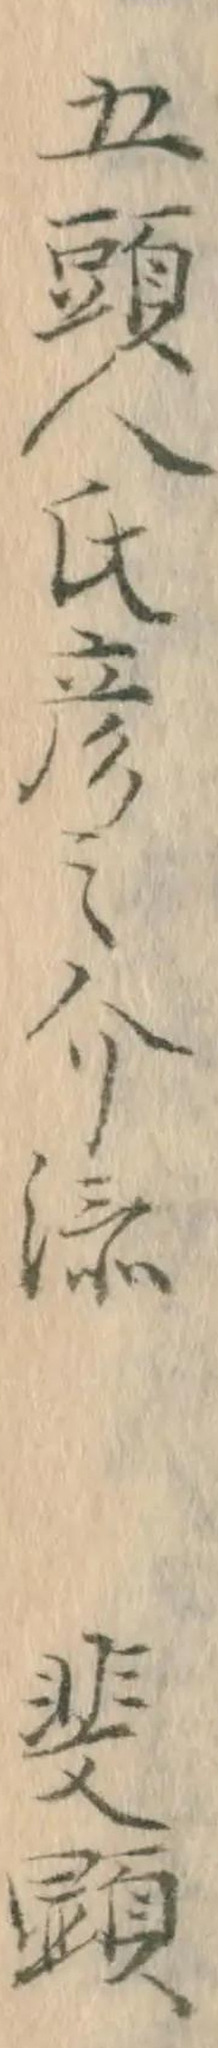五頭人氏彦之介添斐顕

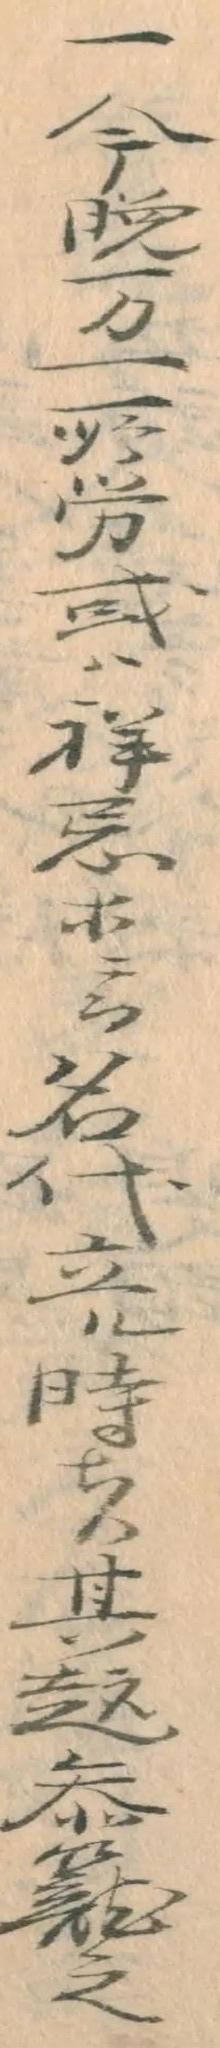一今晩万一所労或ハ祥忌等ニ而名代立ル時者其趣参籠之
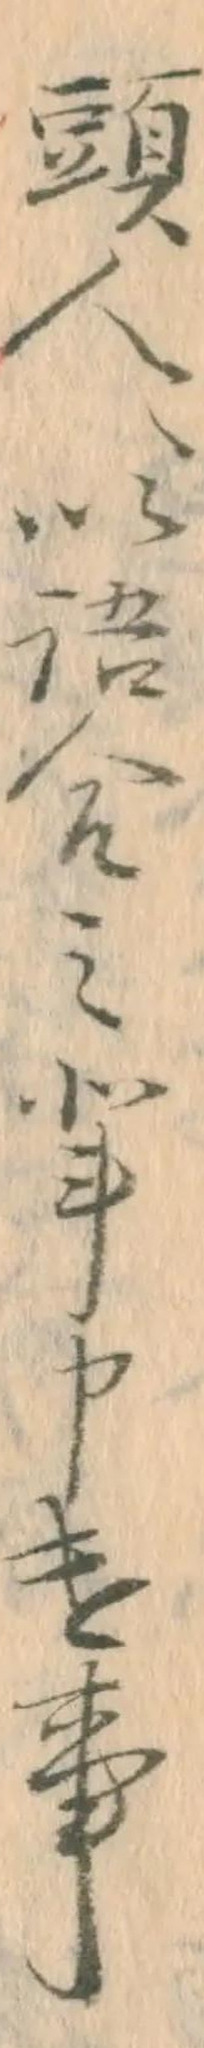頭人へ以語合之輩申遣事
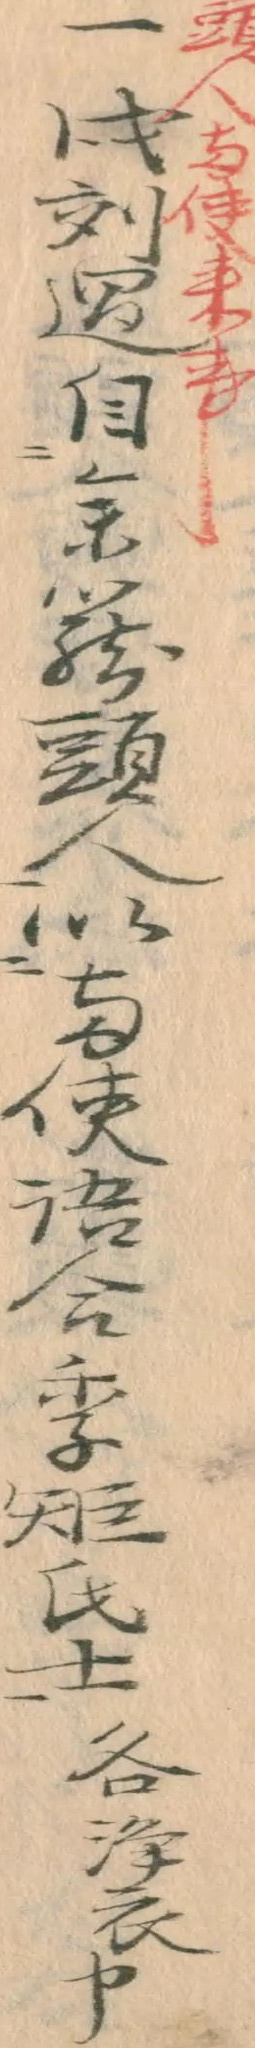一戌刻過自参籠頭人以両使語合季矩氏士各浄衣申
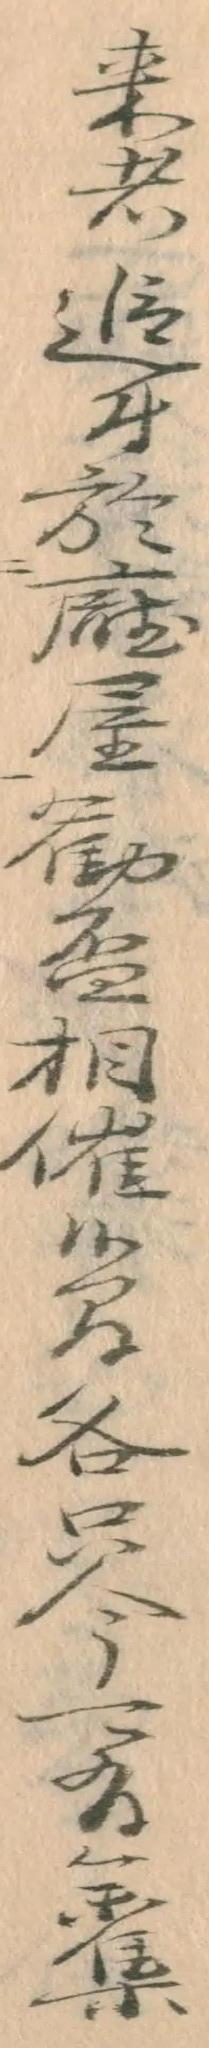来者追付於廰屋勧盃相催候間各只今可有参集
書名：賀茂社記録. 第72冊
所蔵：国立国会図書館 National Diet Library, JAPAN
